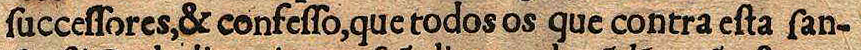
successores, & confesso, que todos os que contra esta san
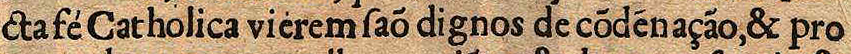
cta fé Catholica vierem saõ dignos de cōdēnação, & pro
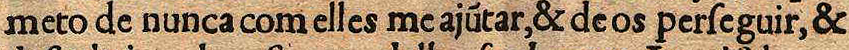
meto de nunca com elles me ajūtar, & de os perseguir, &
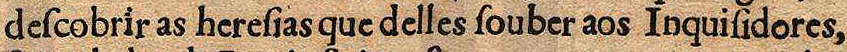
descobrir as heresias que delles souber aos Inquisidores,
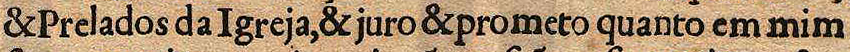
& Prelados da Igreja, & juro, & prometo quanto em mim
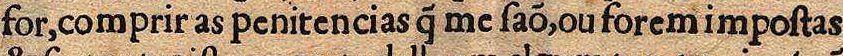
for, comprir as penitencias q̄ me saõ, ou forem impostas
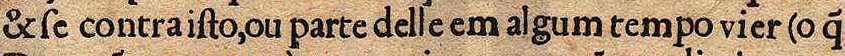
& se contra isto, ou parte delle em algum tempo vier (o q̄
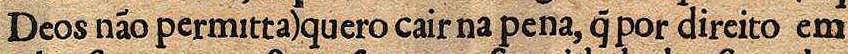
Deos não permitta) quero cair na pena, q̄ por direito em
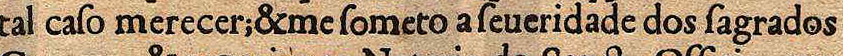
tal caso merecer; & me someto a seueridade dos sagrados
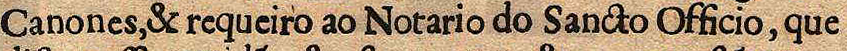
Canones, & requeiro ao Notario do Sancto Officio, que
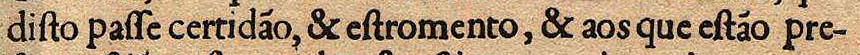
disto passe certidão, & estromento, & aos que estão pre
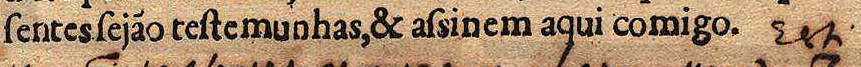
sentes sejão testemunhas, & assinem aqui comigo. E esti
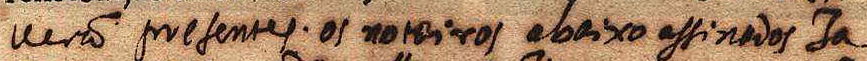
ueraõ presentes. os notairos abaixo assinados Ia
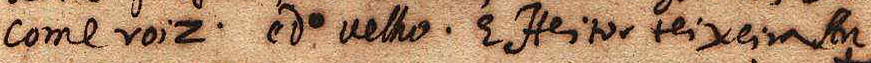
come roiz e do velho. E Heitor teixeira An
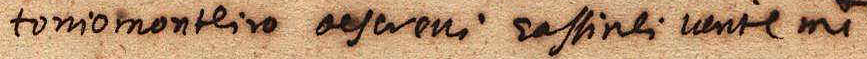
tonio monteiro o escreui. E assinei iuntemete
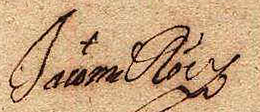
Jacome Roīz
